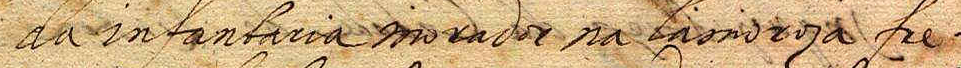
da infantaria morador na lamoroza fre
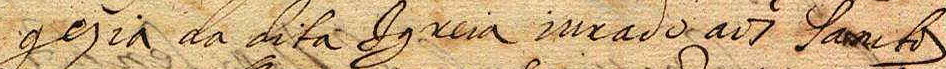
gezia da dita Igreia iurado aos Sanctos
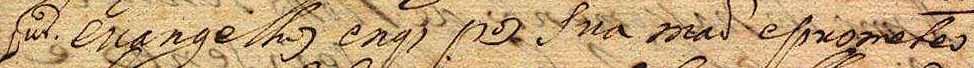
euangelhos en q̄ pos sua maõ e prometeo
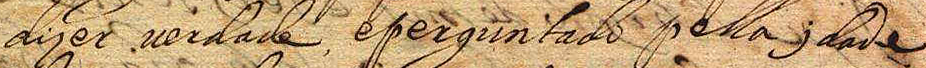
dizer uerdade, e perguntado pella jdade
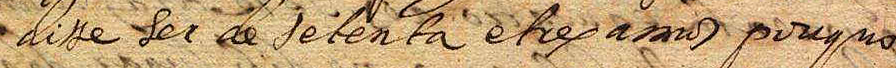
disse ser de setenta e tres annos pouquo
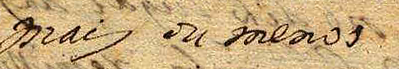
mais ou menos
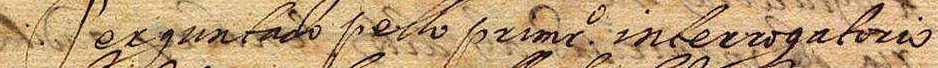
Perguntado pello primr.o interrogatorio
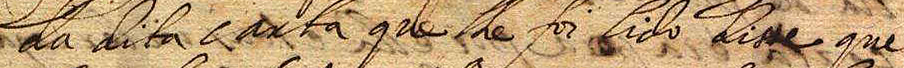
da dita carta que lhe foi lido disse que
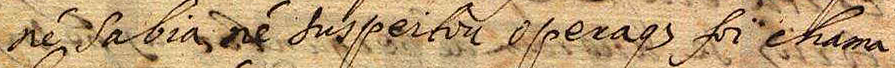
nē sabia nē suspeitou o pera q̄ foi chama
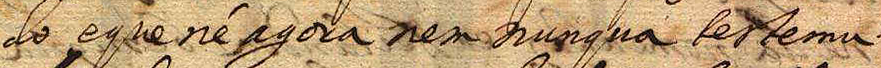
do e que nē agora nem nunqua testemu
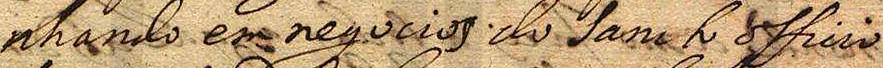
nhando em negocios do Sancto officio
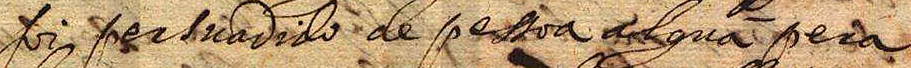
foi persuadido de pessoa alguā pera
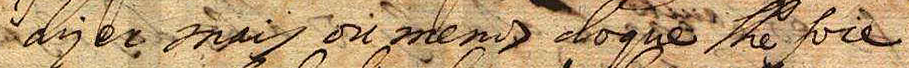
dizer mais ou menos do que lhe fose
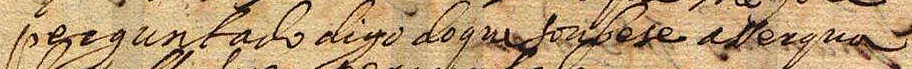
perguntado digo do que soubese asserqua
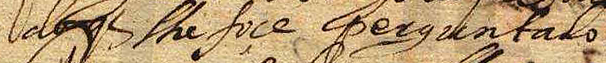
do q̄ lhe foçe perguntado
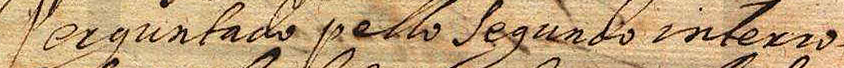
Perguntado pello segundo interro
